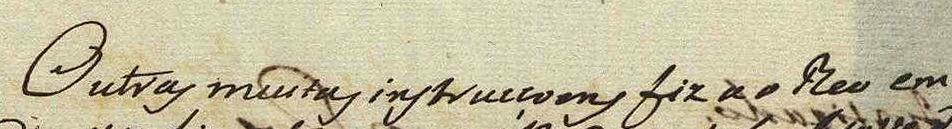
Outras muitas instrucçoens fiz ao Reo em
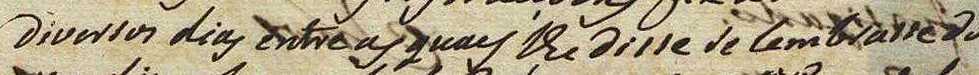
diversos dias entre as quaes lhe disse se lembrasse do
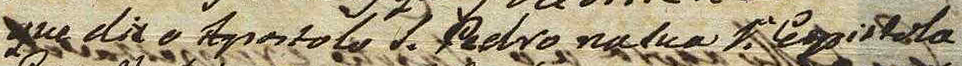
que diz o Apostolo S. Pedro na sua 1.a Epistola
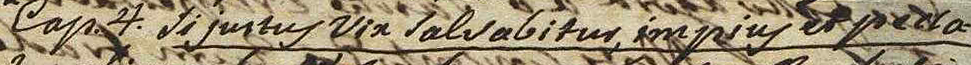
Cap. 4. si justus vix salvabitur, impius et pecca
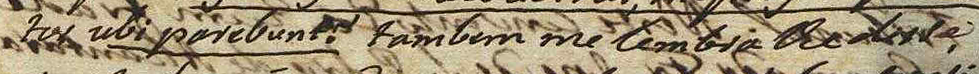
tor ubi parebunt. tambem me lembra lhe disse,
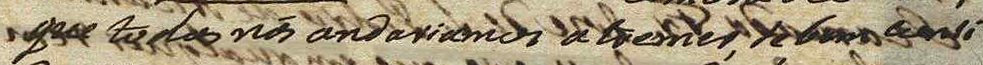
que todos nós andariamos a tremer, se bem consi
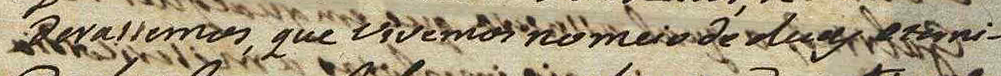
derassemos, que vivemos no meio de duas eterni
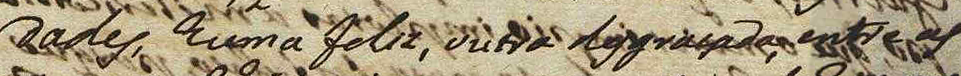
dades, huma feliz, outra desgraçada, entre as
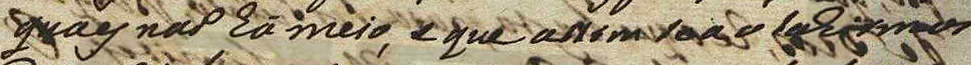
quaes naõ há meio, e que assim se ao sahirmos
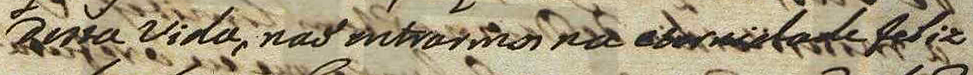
desta vida, naõ entrarmos na eternidade feliz
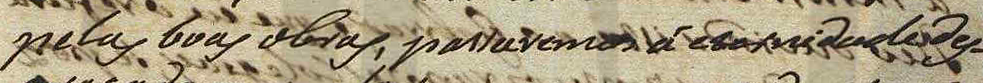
pelas boas obras, passaremos á eternidade des
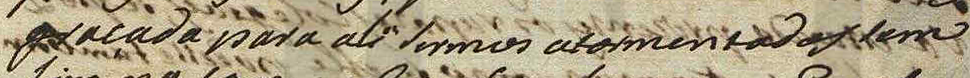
graçada para ali sermos atormentados sem
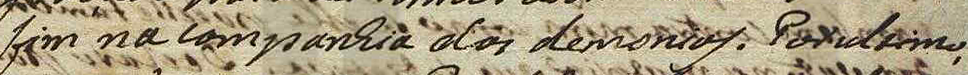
fim na companhia dos demonios. Por ultimo,
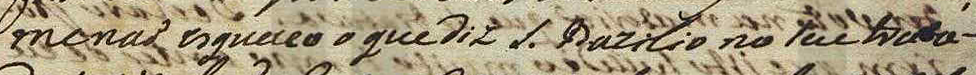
me naõ esqueceo o que diz S. Bazilio no seu trata
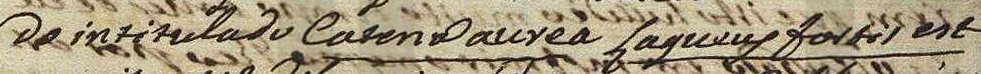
do intitulado Catena aurea Laqueus fortis est
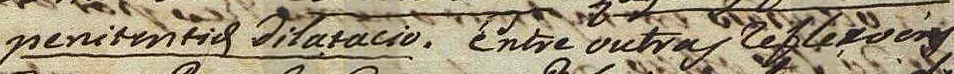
penitentia dilatacio. entre outras Refleçoẽns
